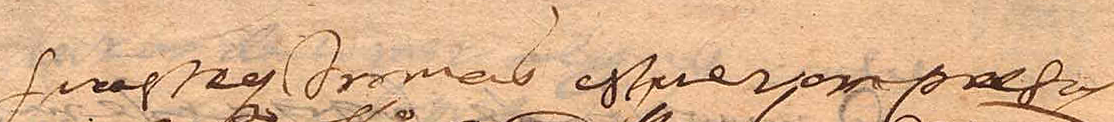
suas tres Irmas̄ estiueram presas
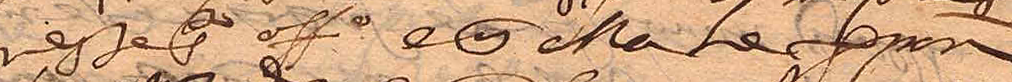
neste sto offo. e q̄ ella he xpam̄
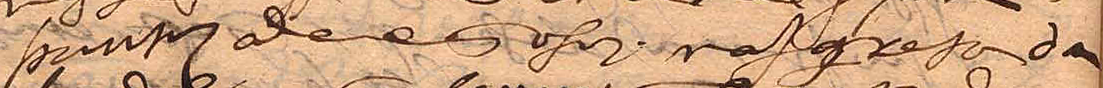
bautizada e q̄ o foj na Jgreja da
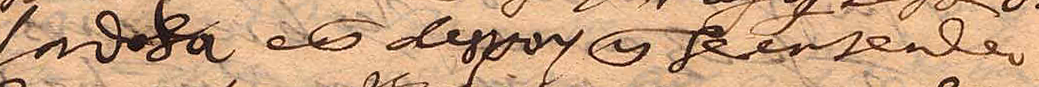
Ladosa e q̄ despoy q̄ se entendeo
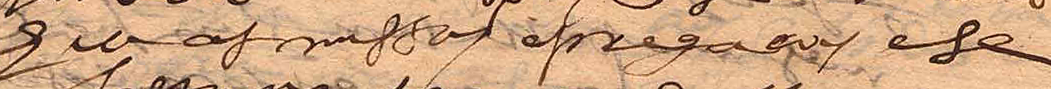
hia as missas e pregacoes e se
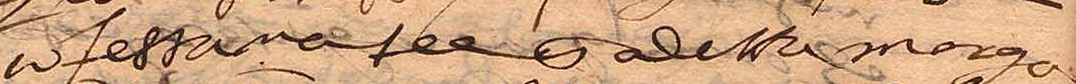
cōfessaua tee q̄ a ditta marga
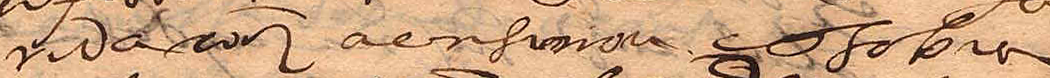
rida roīz a ensinou. e q̄ sabia
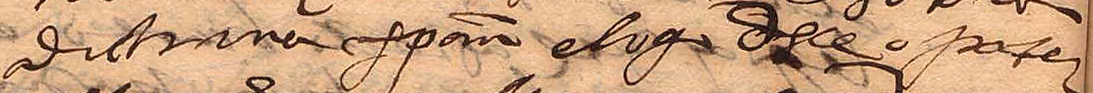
a doctrina xpam̄ e logo disse o pater
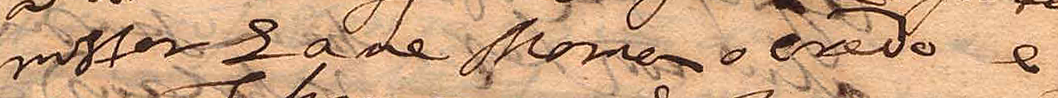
noster E aue Maria o credo e
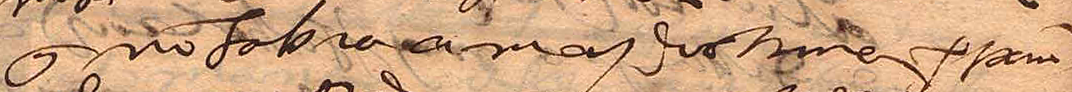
q̄ nō sabia a mais doctrina xpam̄
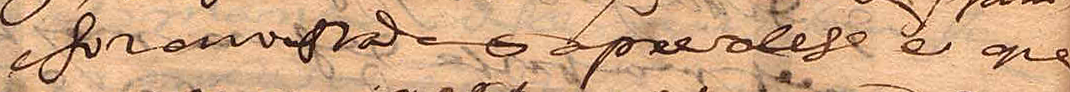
e foi amoestada q̄ apreedese e que
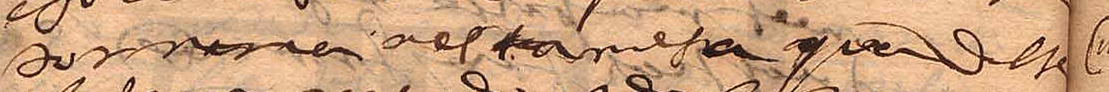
tornaria a esta mesa quādo lhe
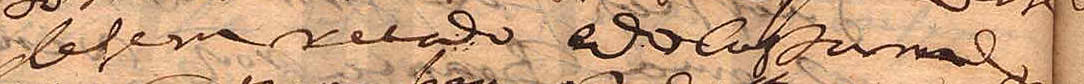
desem recado e do custume
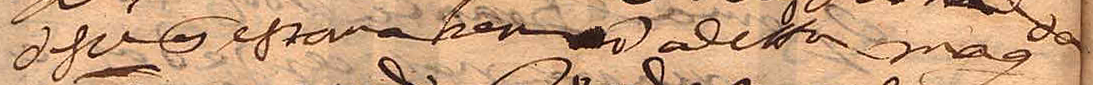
disse q̄ estaua bem cō a ditta magda
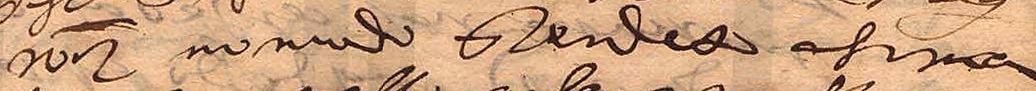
roīz no modo q̄ he dito asima
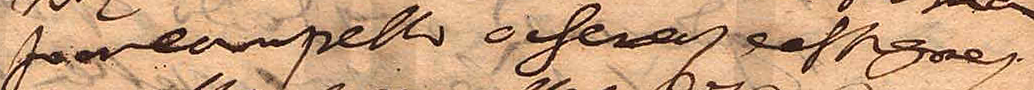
Joam campello o escreuj e assignej
